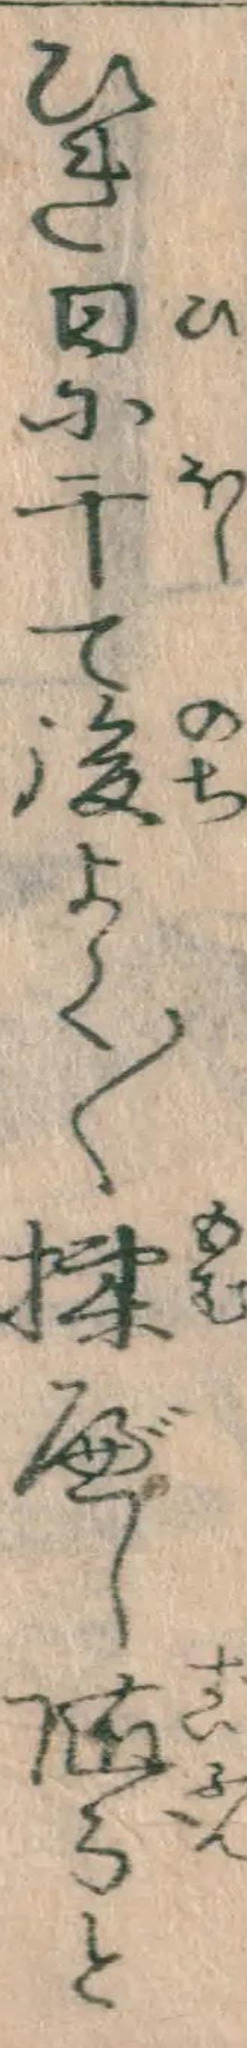ひき日に干て後よく〳〵揉べし随分と
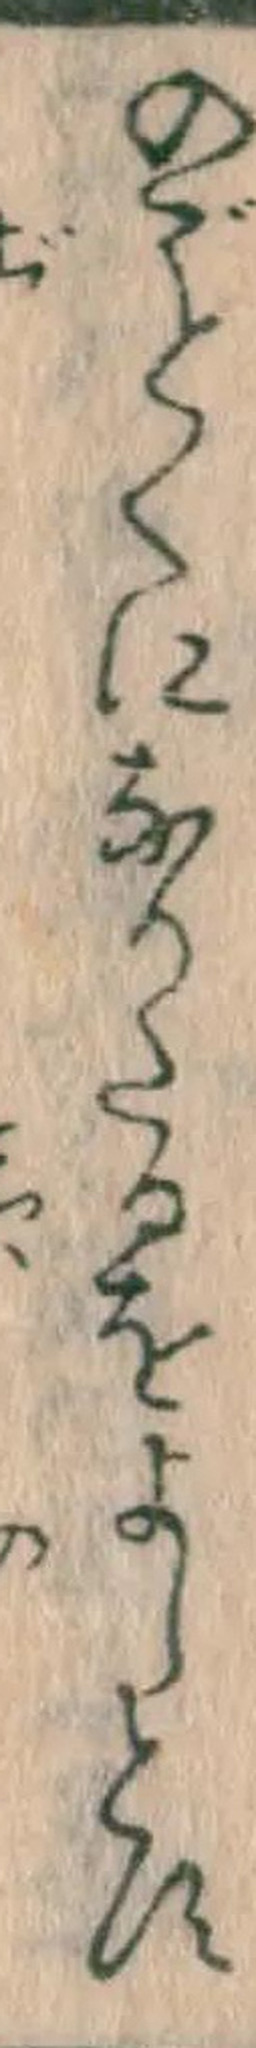のごとくになりたるをよしとす
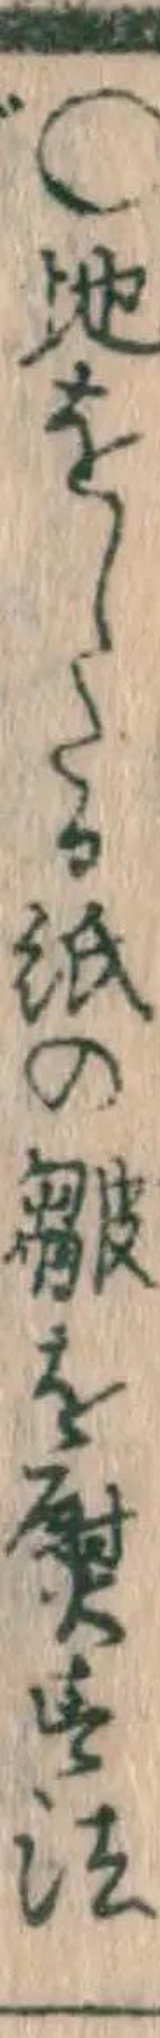○地をしたる紙の皺を熨す法
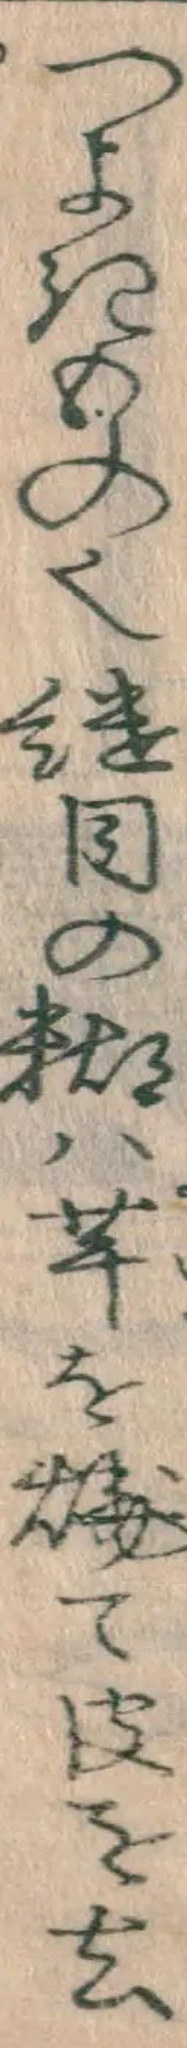つよきもの也継目の糊は芋を焼て皮を去
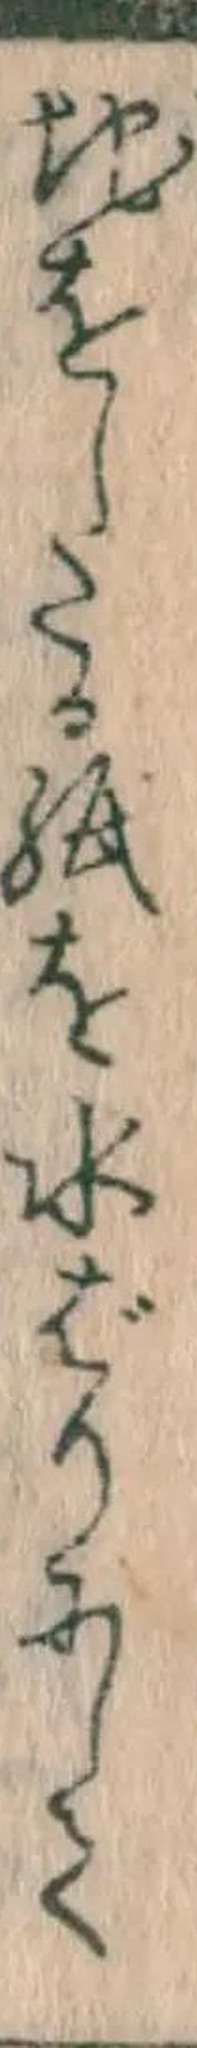地をしたる紙を水ばりにして
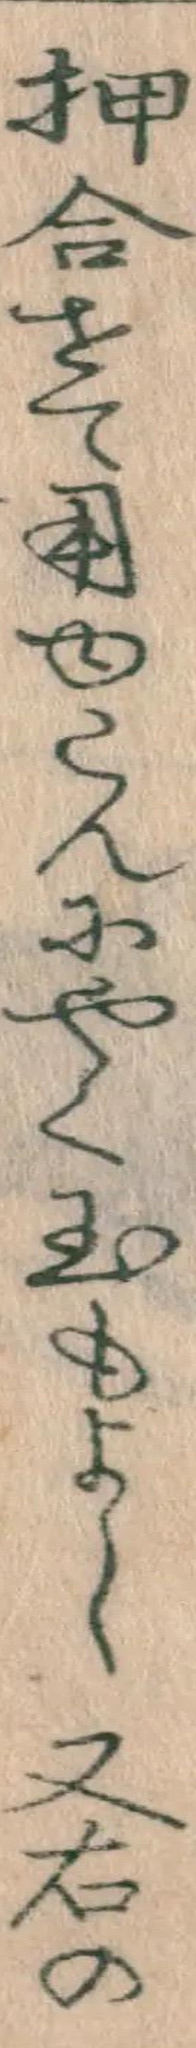押合せて用ゆこんにやく玉もよし又右の
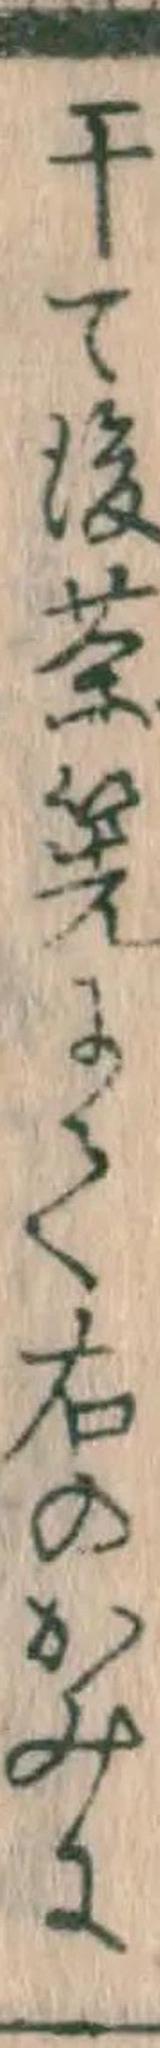干て後茶筅にて右のかみに
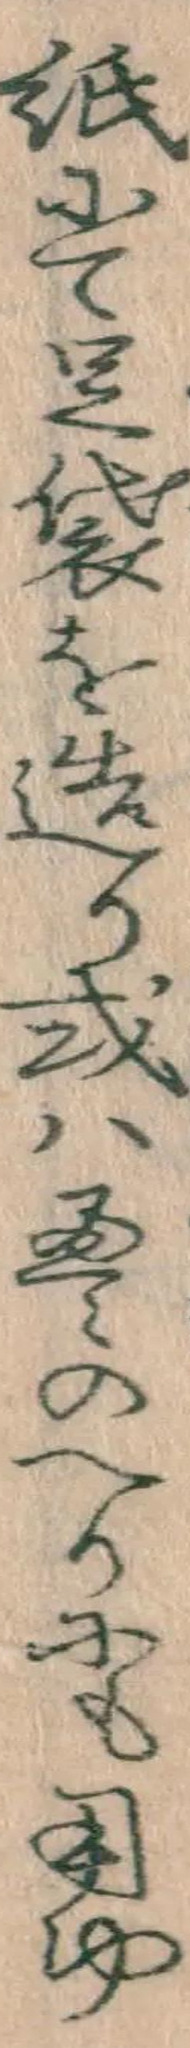紙にて足袋を造り或は畳のへりにも用ゆ
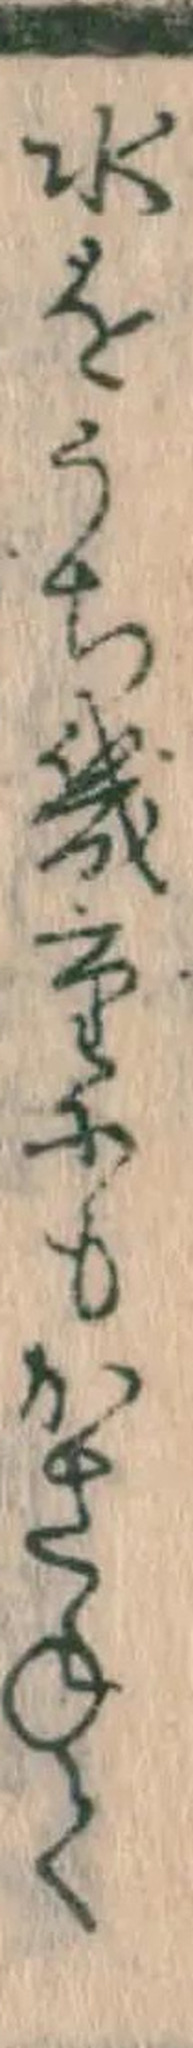水をうち幾重にもかさねて
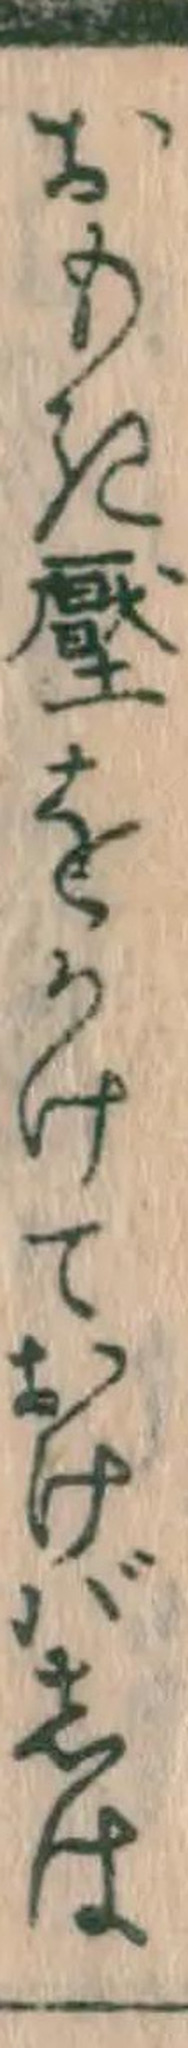おもき壓をかけておけばしは
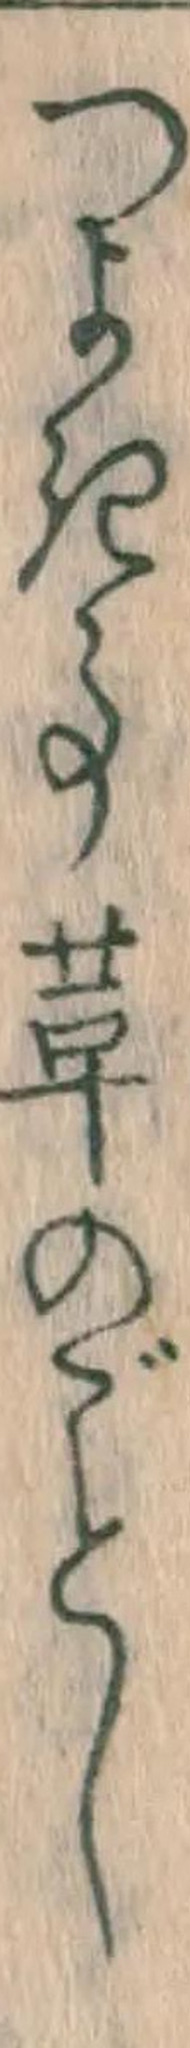つよき事革のごとし
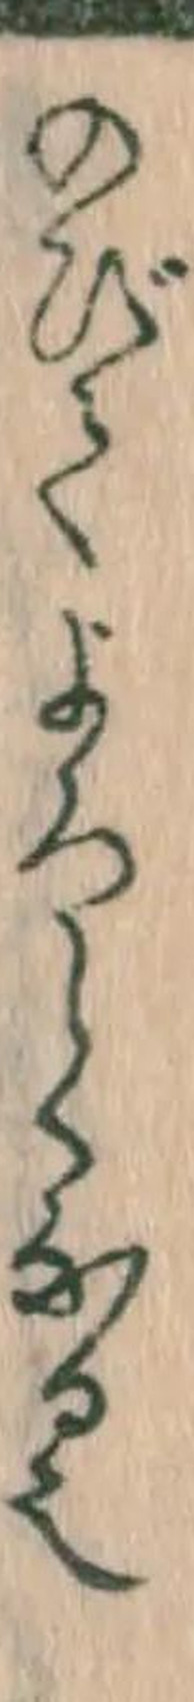のびてよろしくなる也
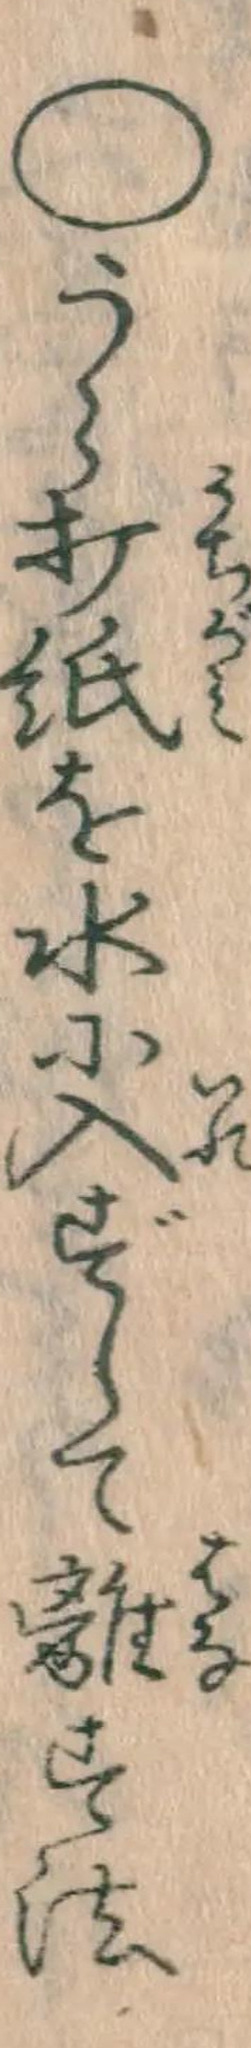○うら打紙を水に入ずして離す法
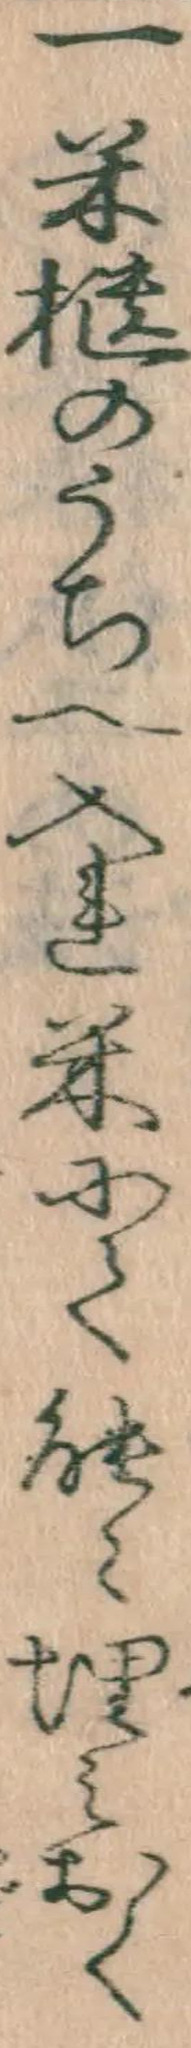一米櫃のうちへ入れ米にて能々埋みおく
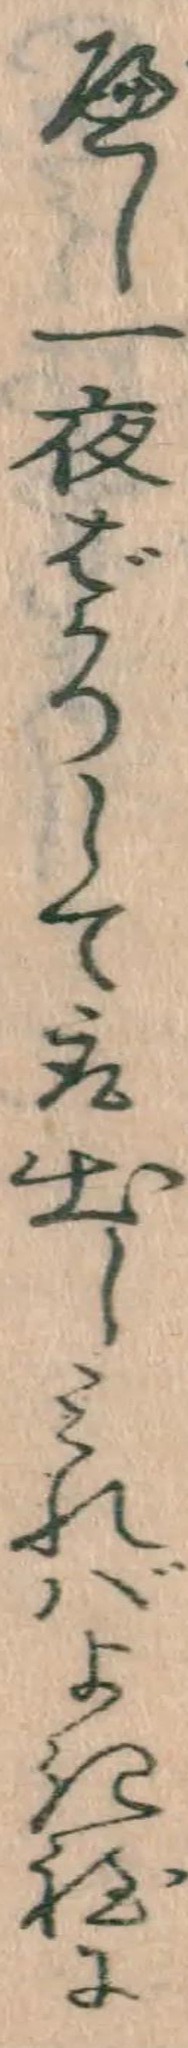べし一夜ばかりして取出しみればよき程に
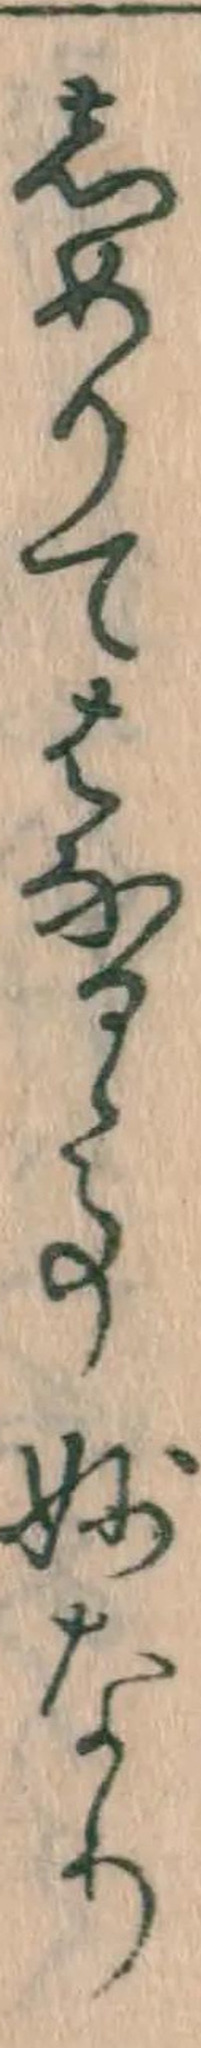しめりてはなるゝ事妙なり
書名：広益秘事大全 3巻. [2]
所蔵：国立国会図書館 National Diet Library, JAPAN
